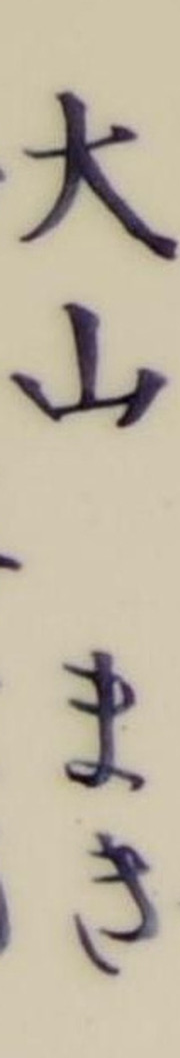大山まき
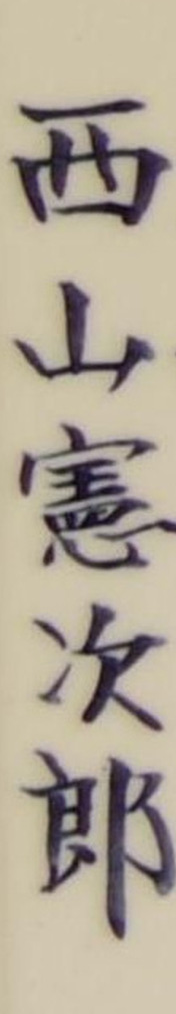西山憲次郎

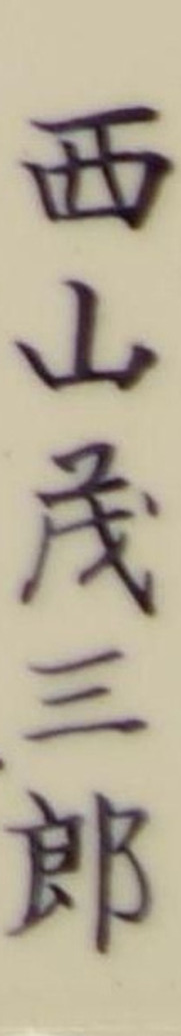西山茂三郎
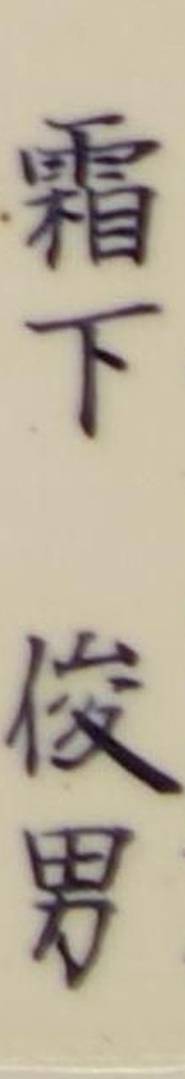霜下俊男
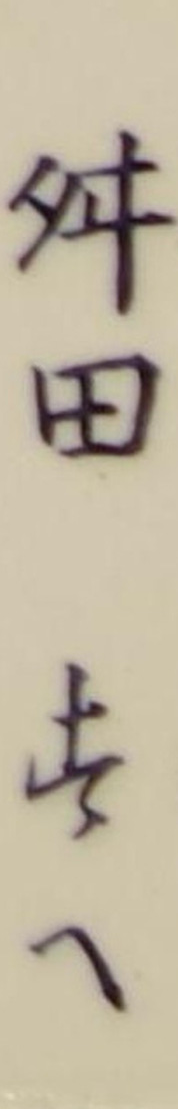舛田すへ
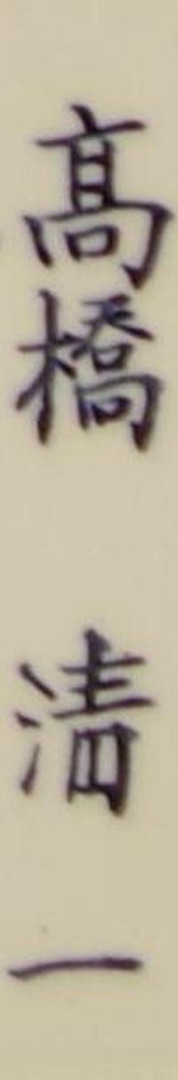高橋清一
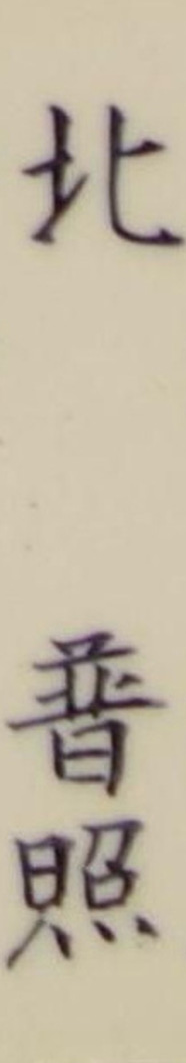北普照
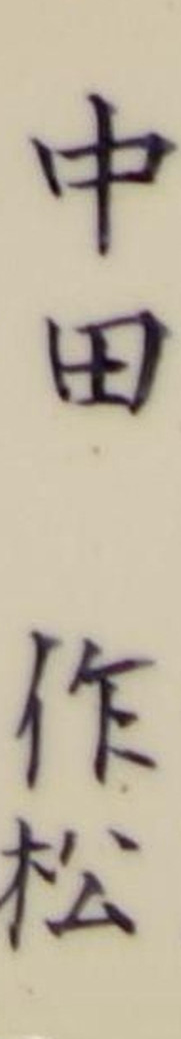中田作松
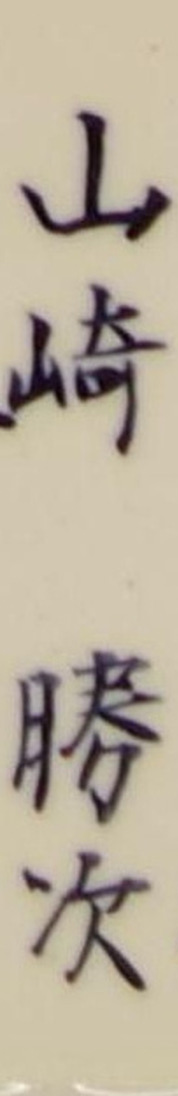山崎勝次
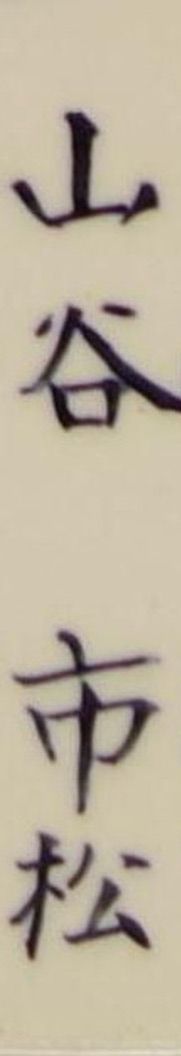山谷市松
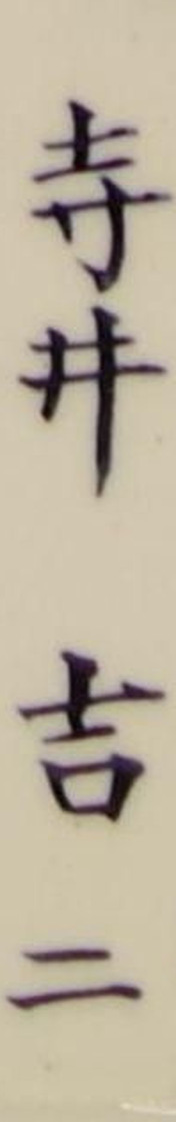寺井吉二
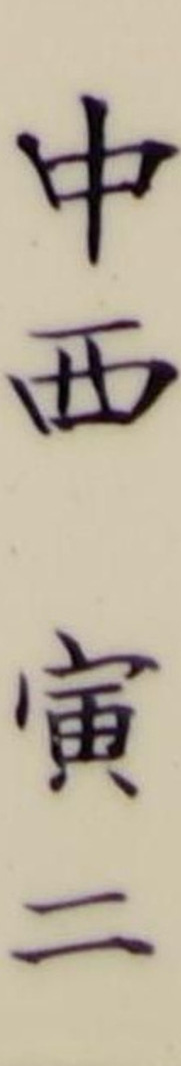中西寅二
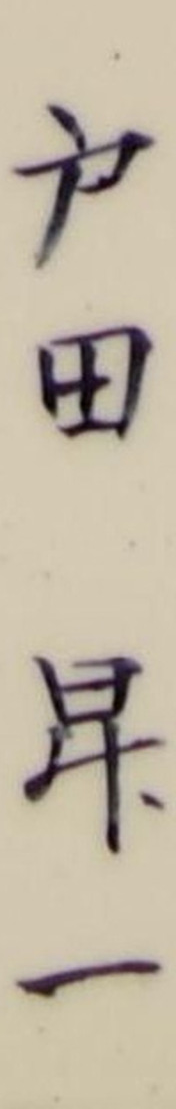戸田昇一
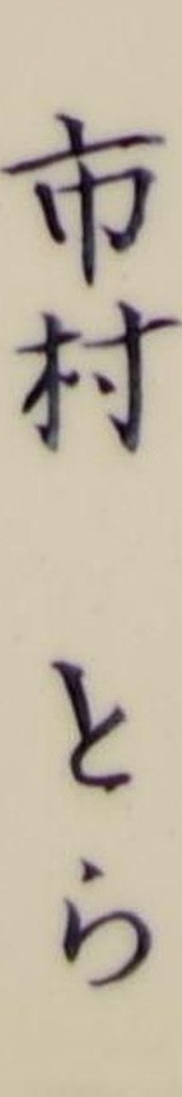市村とら
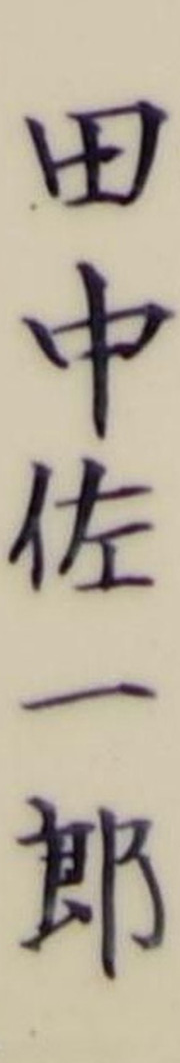田中佐一郎
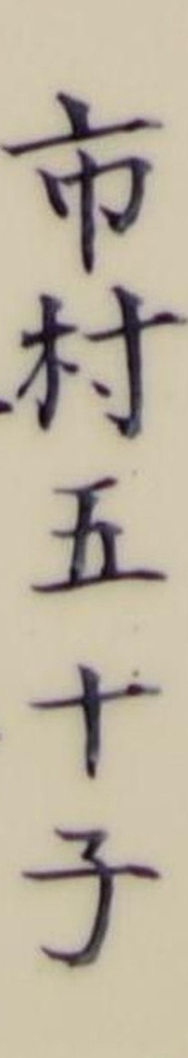市村五十子
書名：A~D
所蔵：koyasan kongobuji
